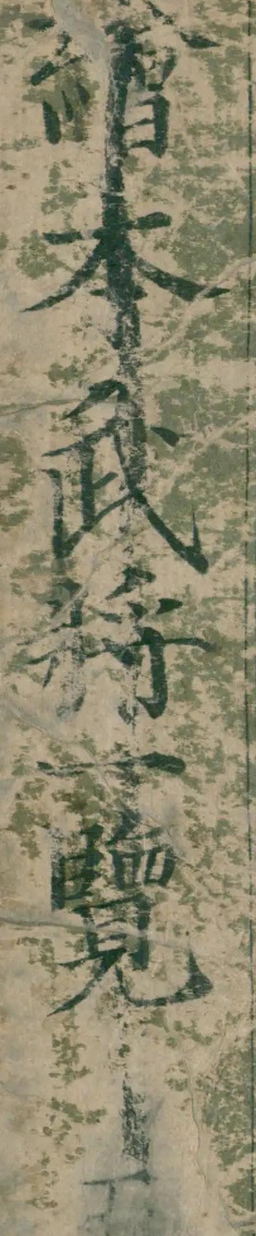繪本武将一覧

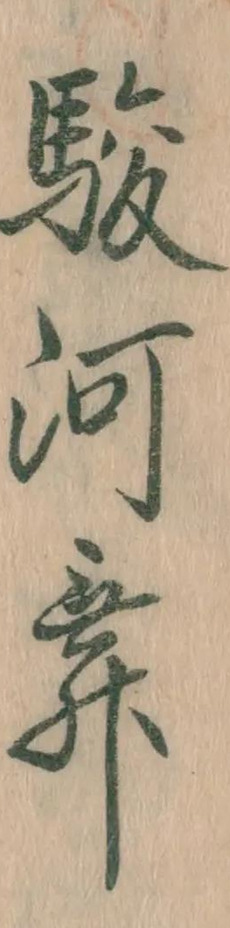駿河舞
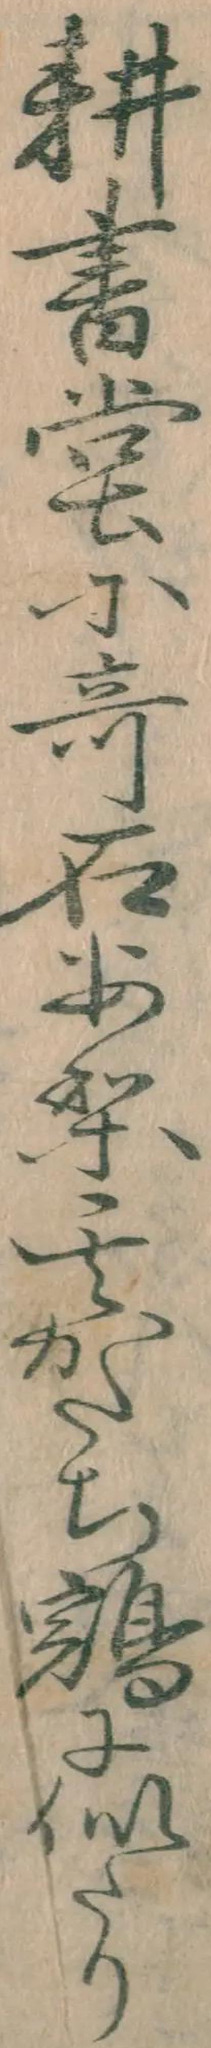耕書堂に奇石あり其かたち鷄に似たり
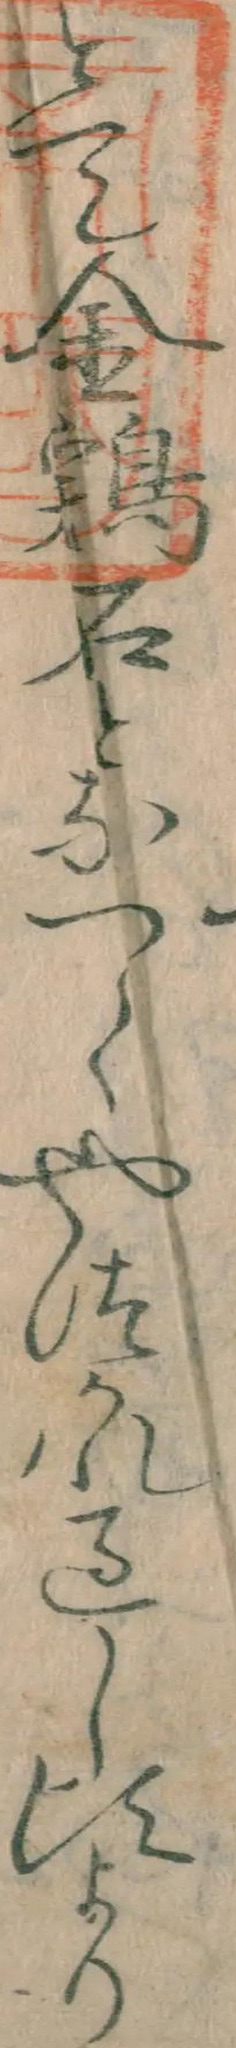とて金鶏石となつくやつかれ過し頃より
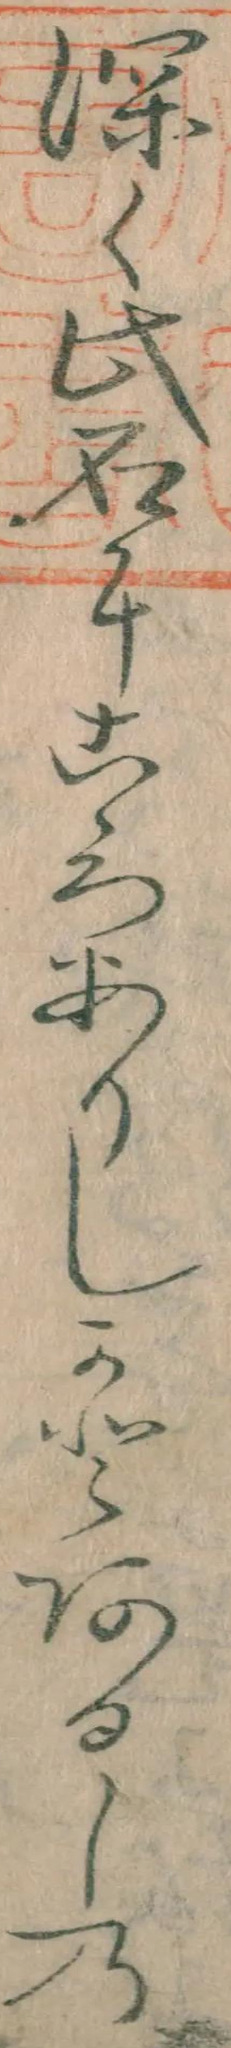深く此石にこゝろありしかとあるしの
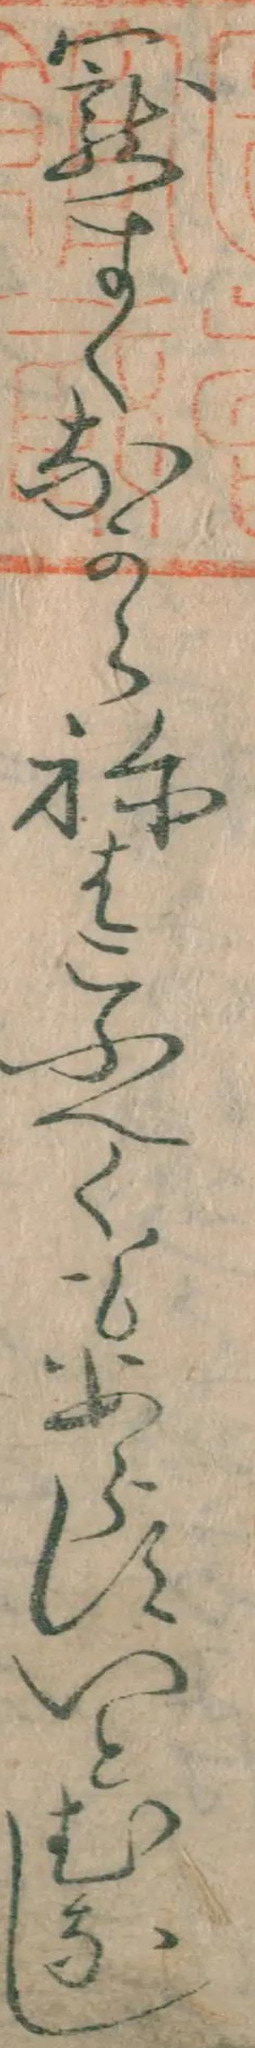寵すくなからねはこふへくもあらすいとむなし
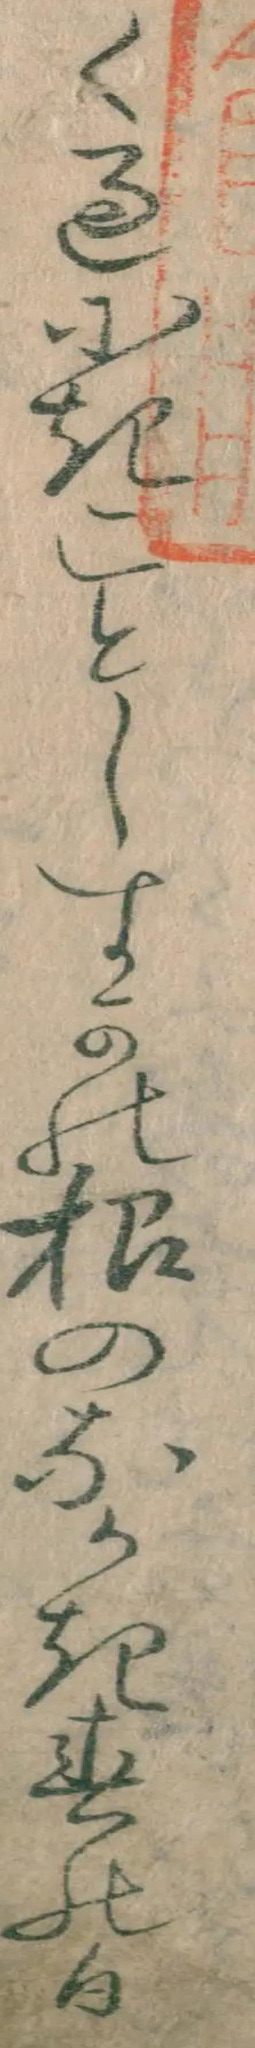く過にきことしすかの根のなかき春の日
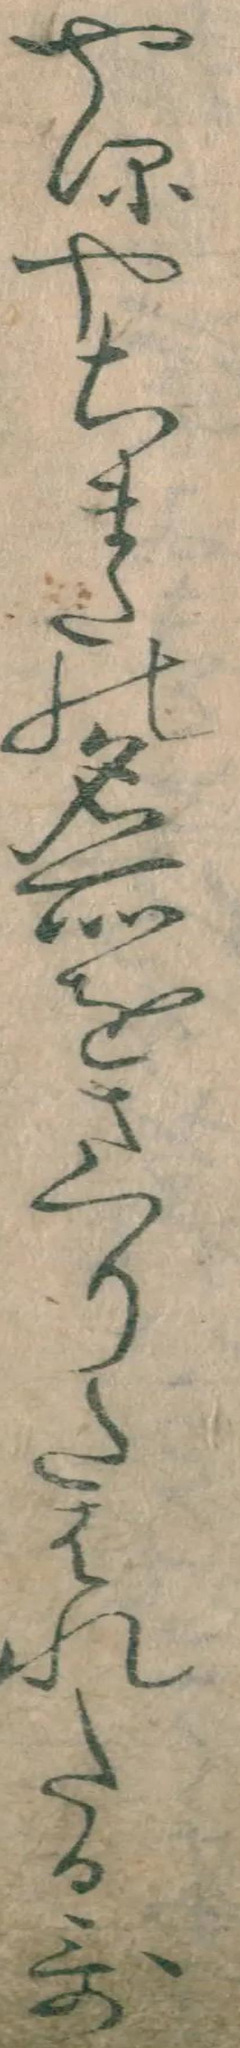やほやちまたの名所をさくりたはれたる歌
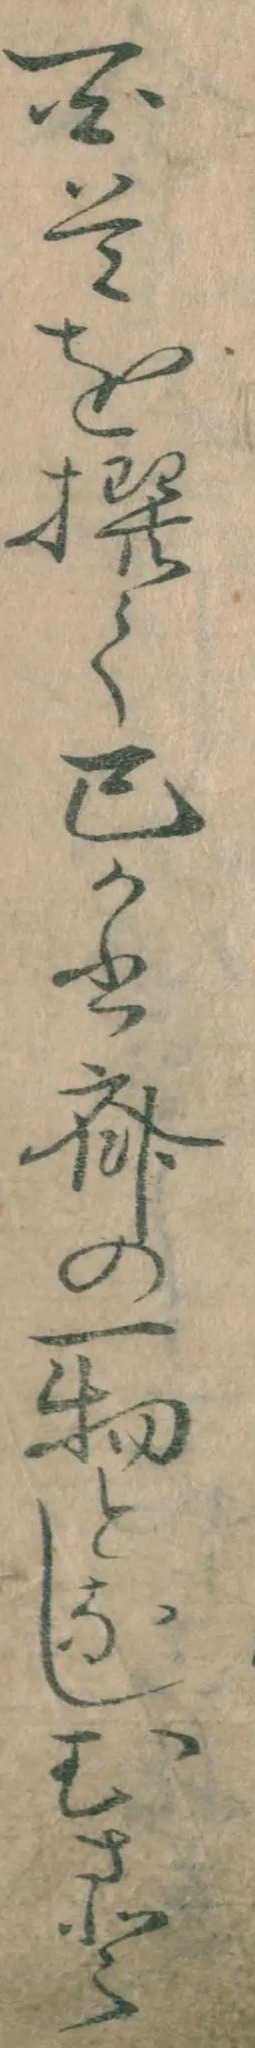百首を撰て己か書斎の一物となしむさと

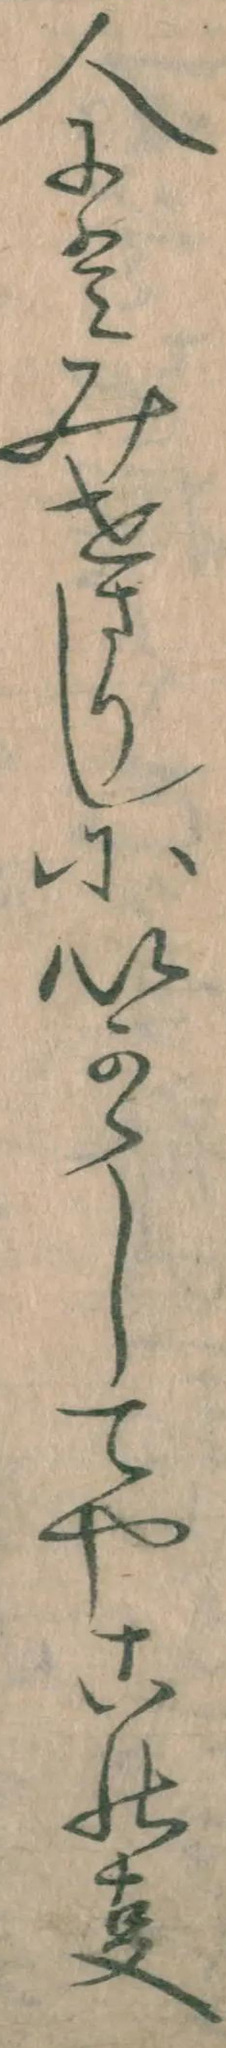人にはみせさりしにいかゝしてやこの事
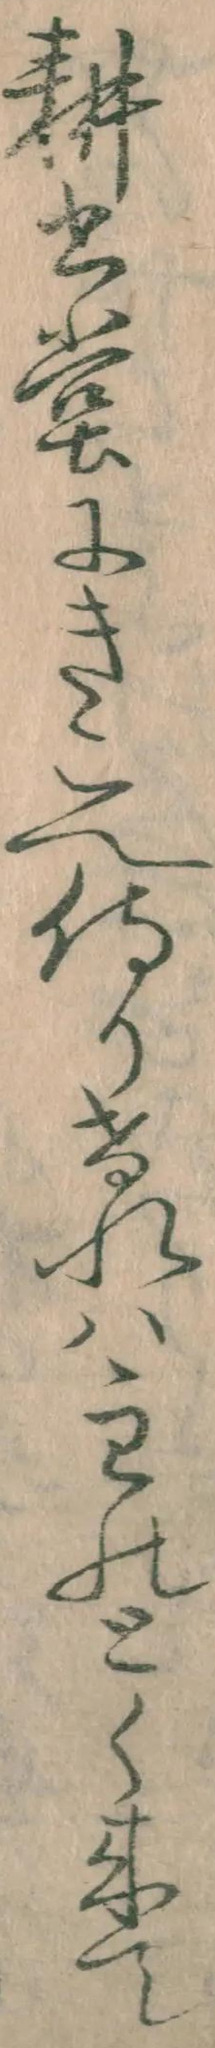耕書堂にきこへ侍りけれは主のとく来て
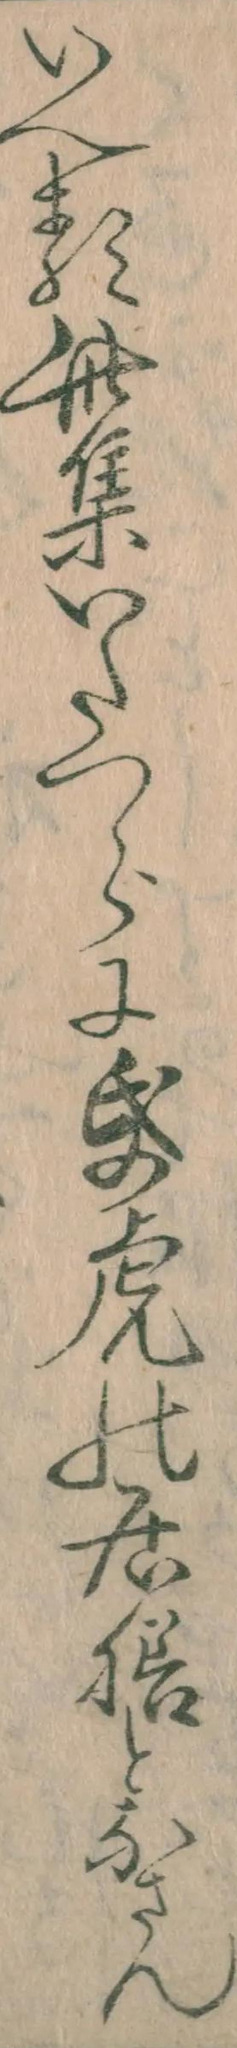いへる此集いたつらに紙虎の居膳となさん
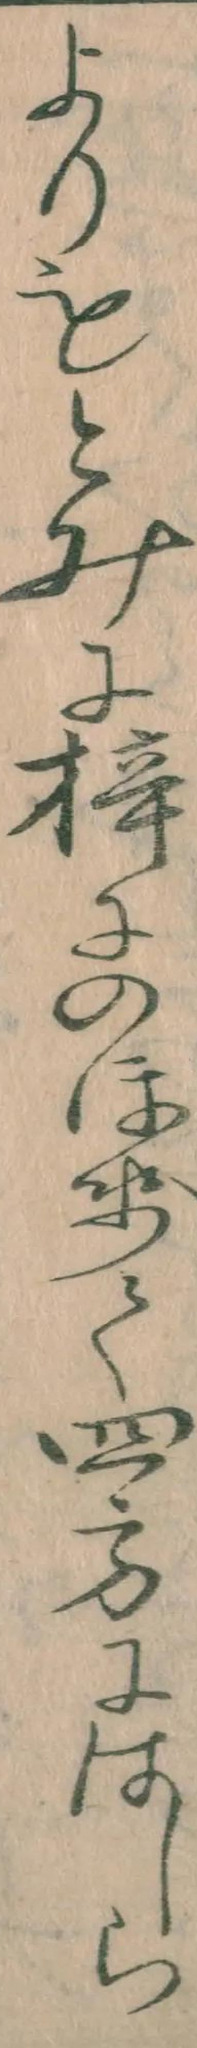よりもとみに梓にのほせて四方にはしら
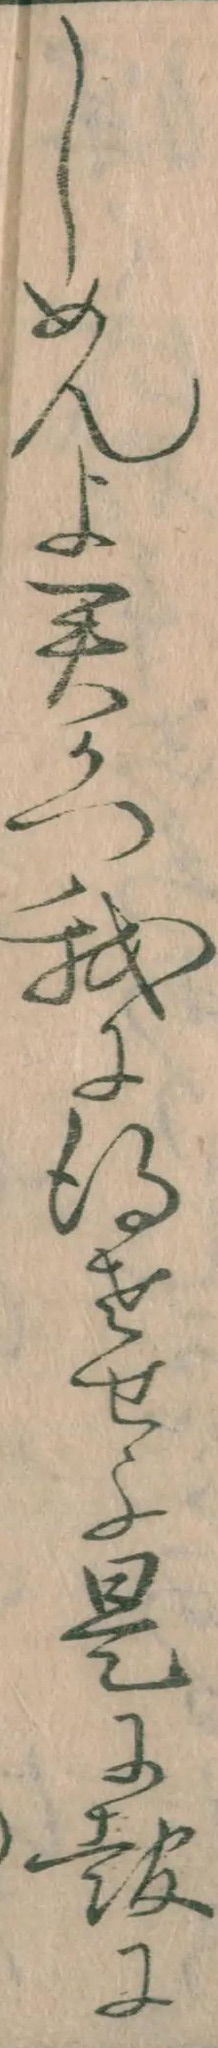しめんよ君かつ我に得させよ是に報？に
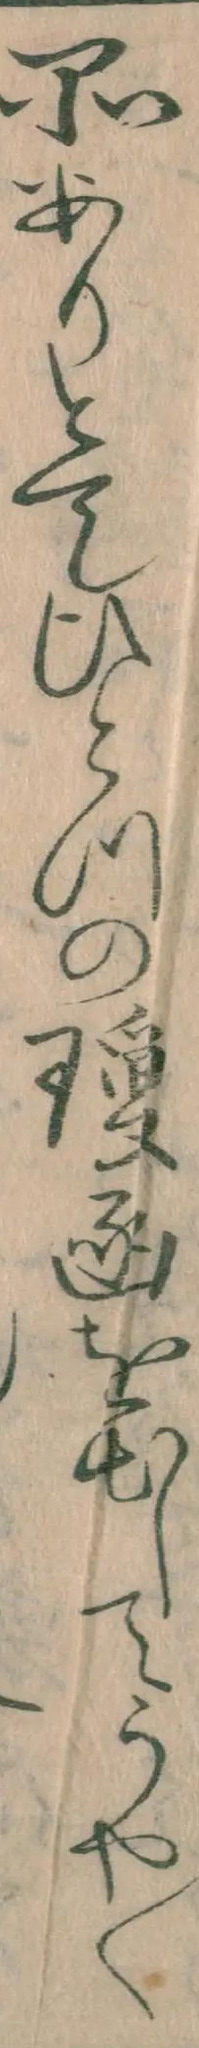品ありとてひとつの璦函を出してうや〳〵
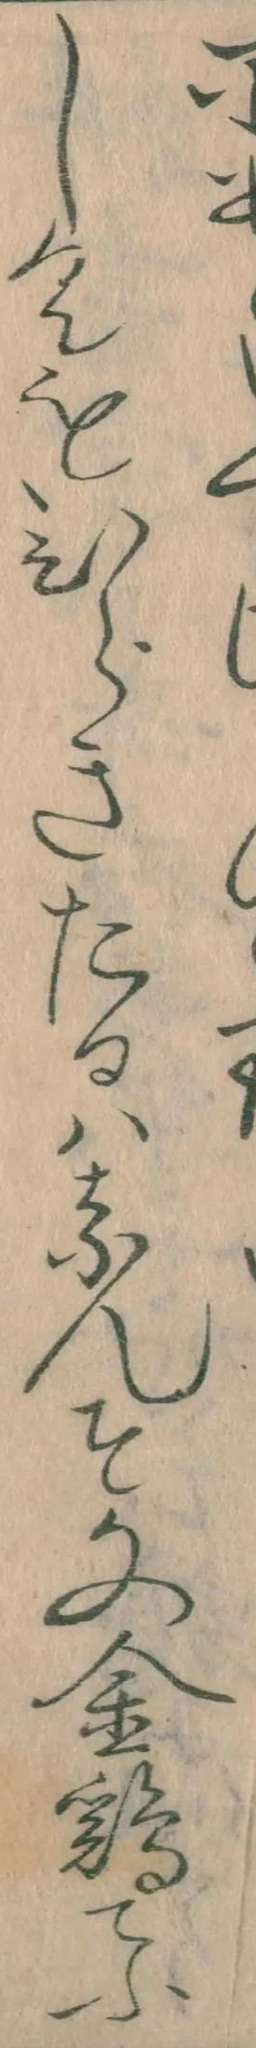しくもひらきたるはなんそかの金鶏てふ
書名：駿河舞 3巻
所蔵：国立国会図書館 National Diet Library, JAPAN
